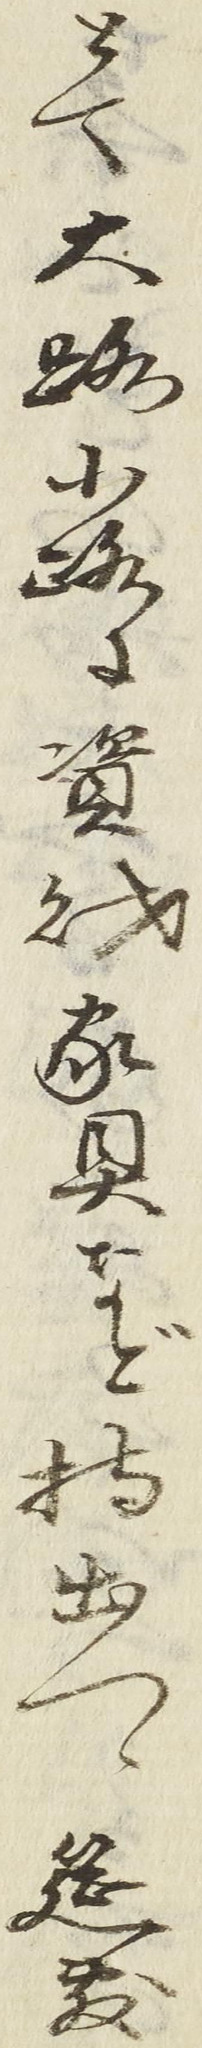とて大路小路に資財家具など持出つゝ筵敷
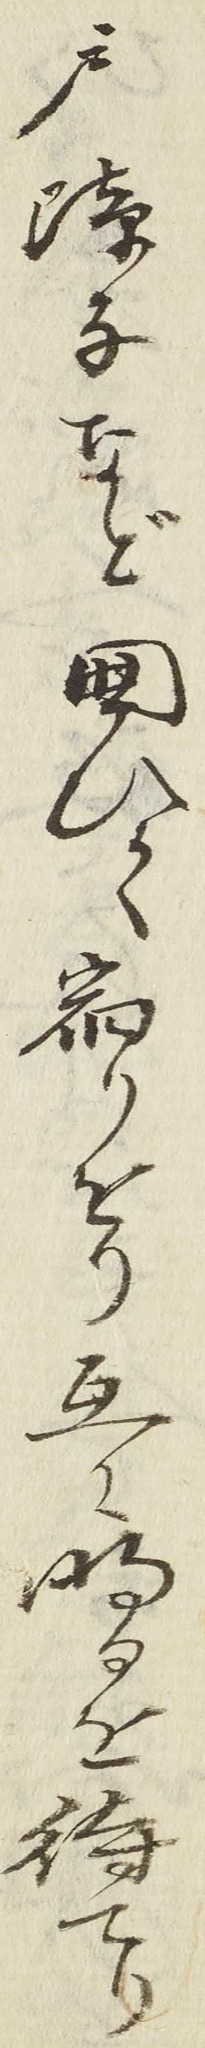戸障子など囲ひて宿りをり互に明るを待てり
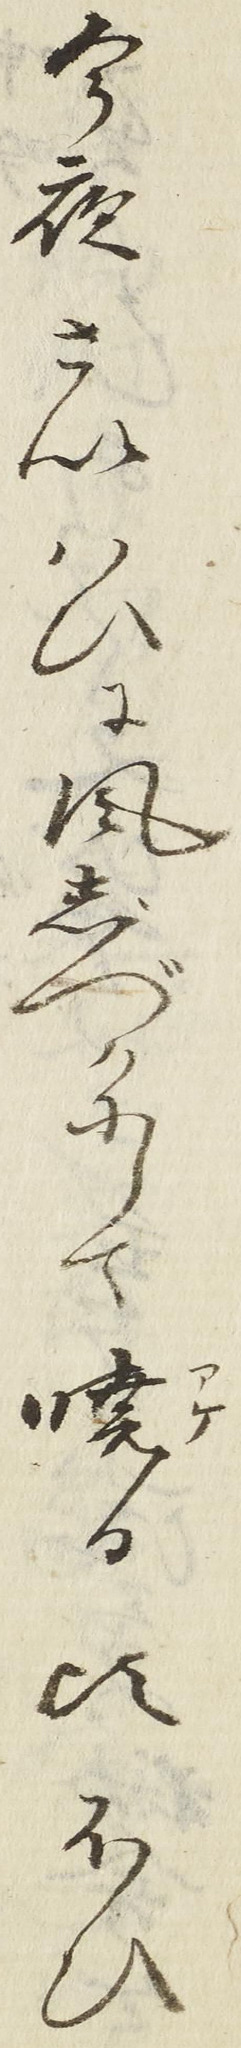今夜さいはひに風しづかにして暁る頃ほひ
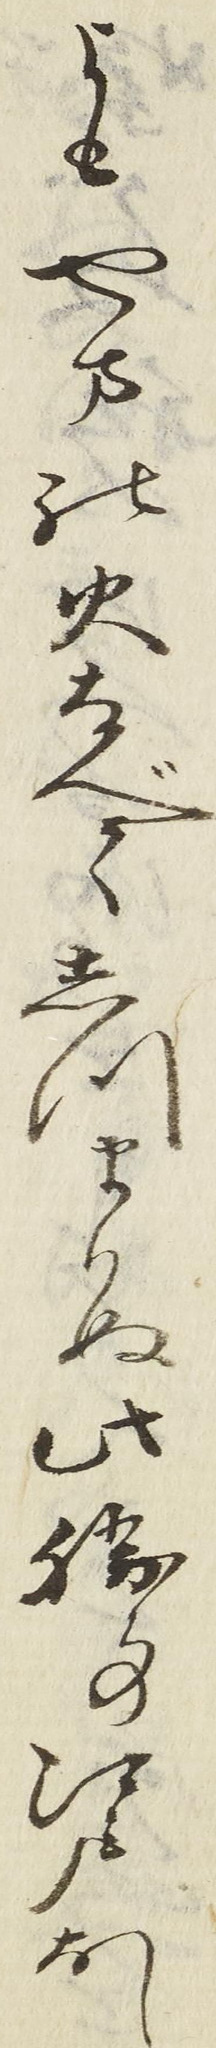よもやまの火なべてしつまりぬ此勝事江戸おし
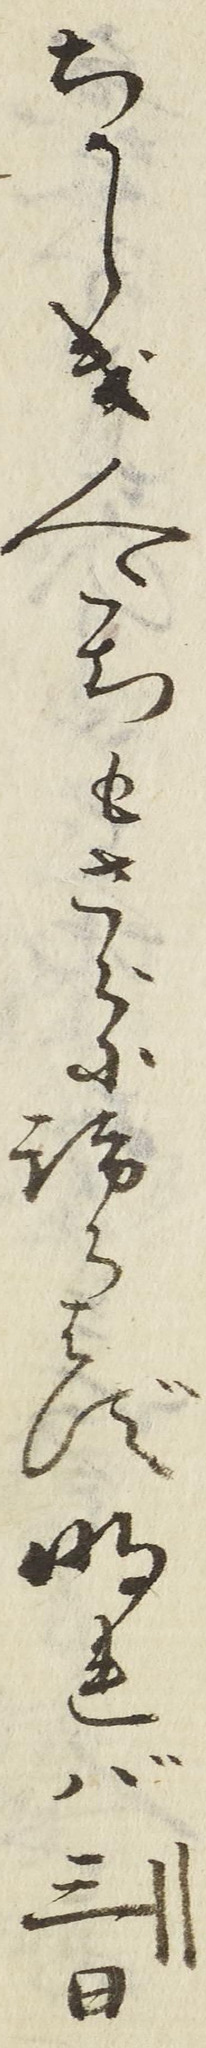ちかしき人たちもさらに訪らはず明れば三日
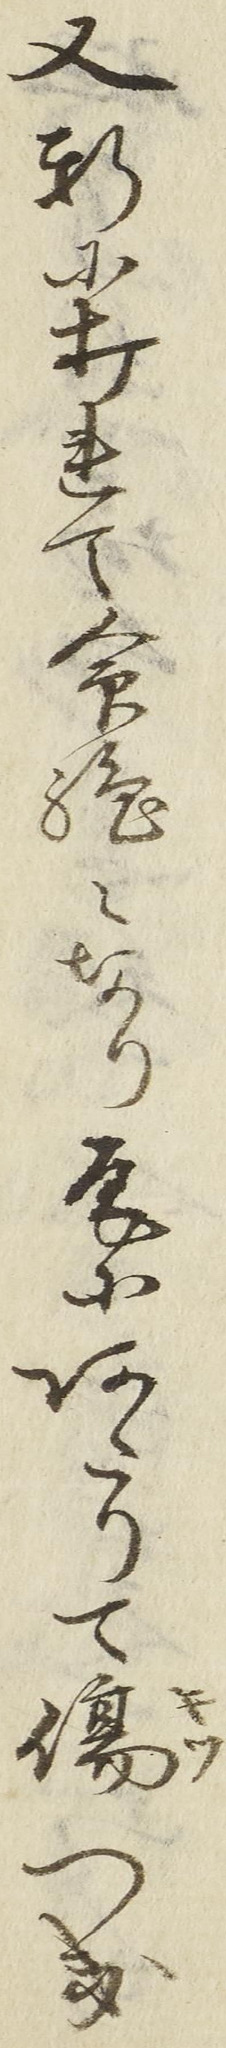又軒に打れて命絶になり瓦にあたりて傷つき

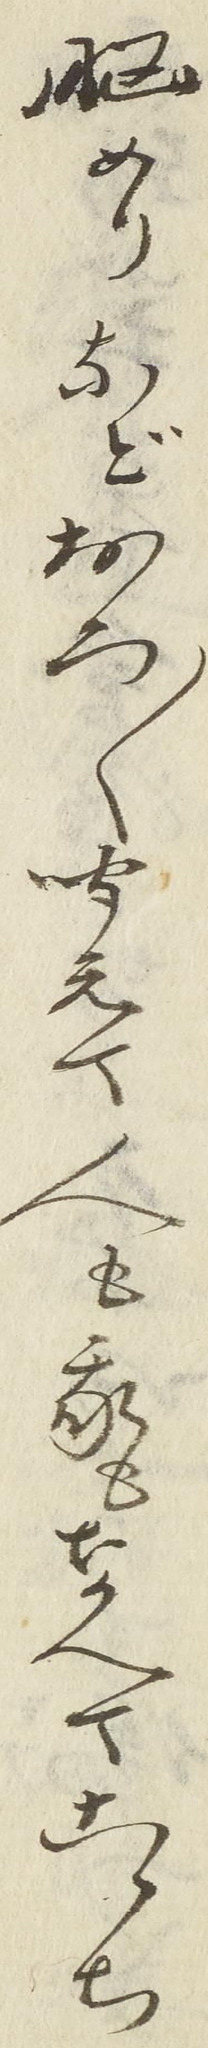脳めりなどおろ〳〵聞えて人も家もなへてこゝち
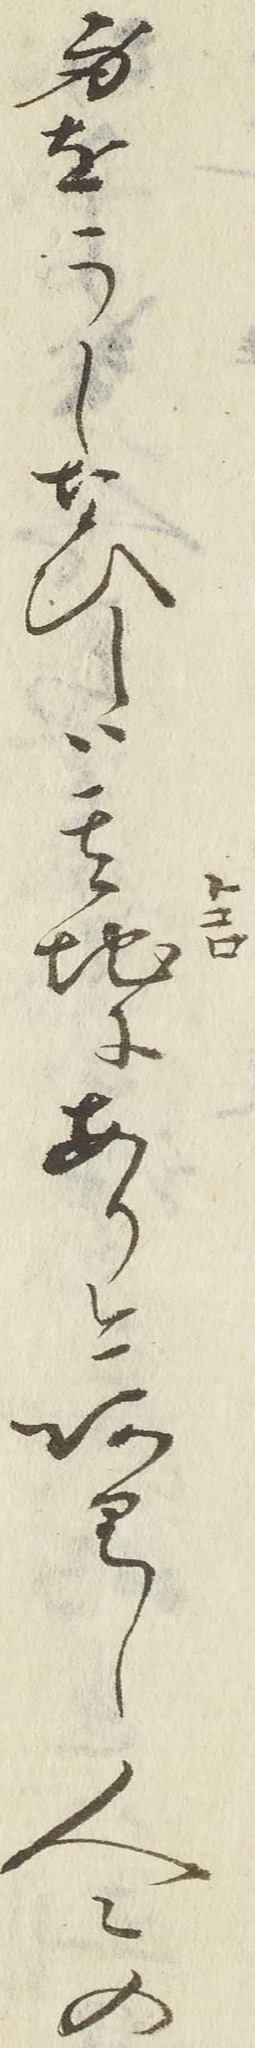身をうしなひしは其地にありとありし人〻の
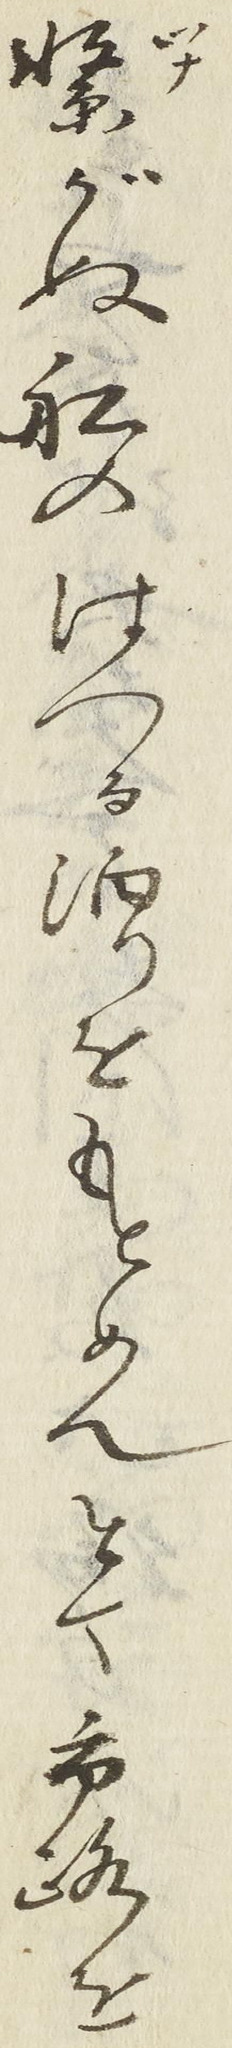繋がぬ船のはつる泊りをもとめんとて市路を
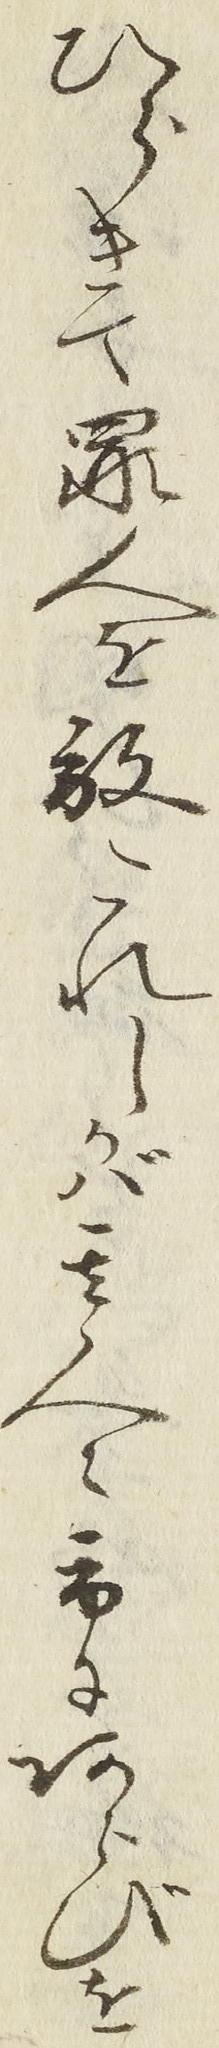ひらきて罪人を放たれしかば其人〻市にあらびを
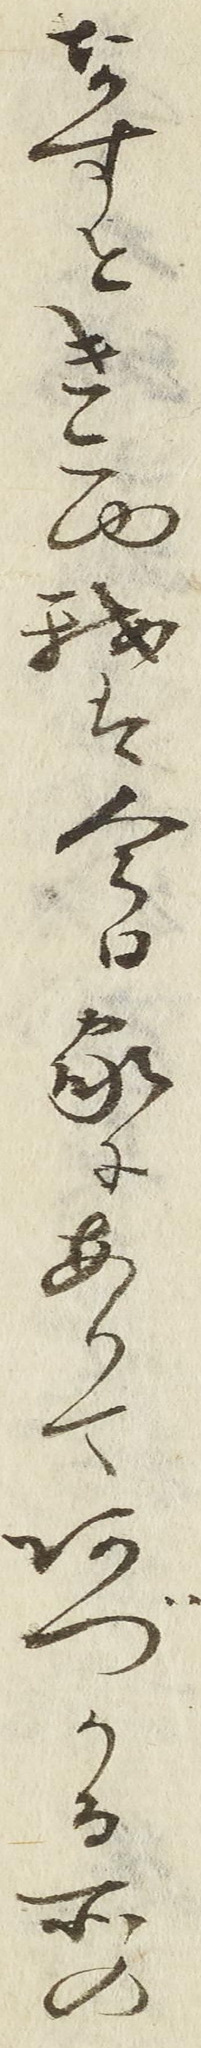なすときこゆ我は今日家にありてあづかる所の
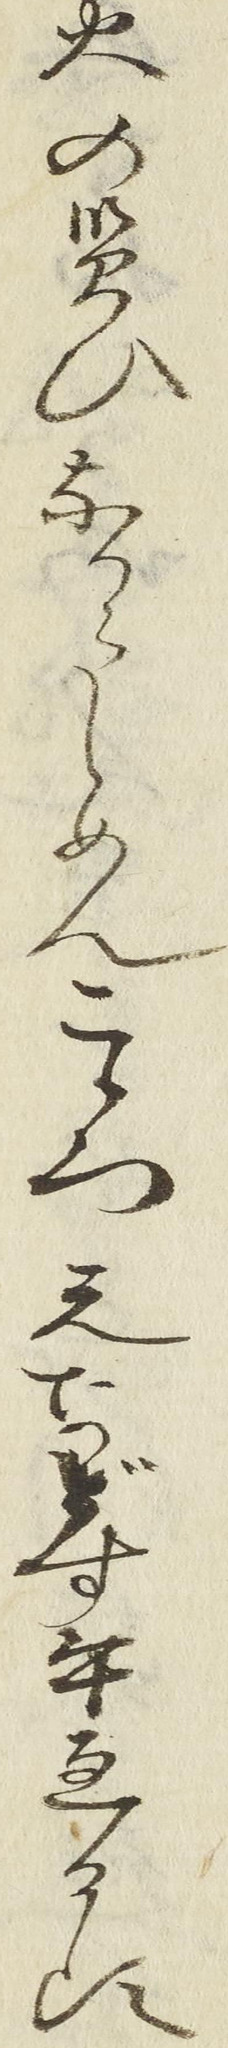火の災ひなからしめんこゝろえなどす午過る頃
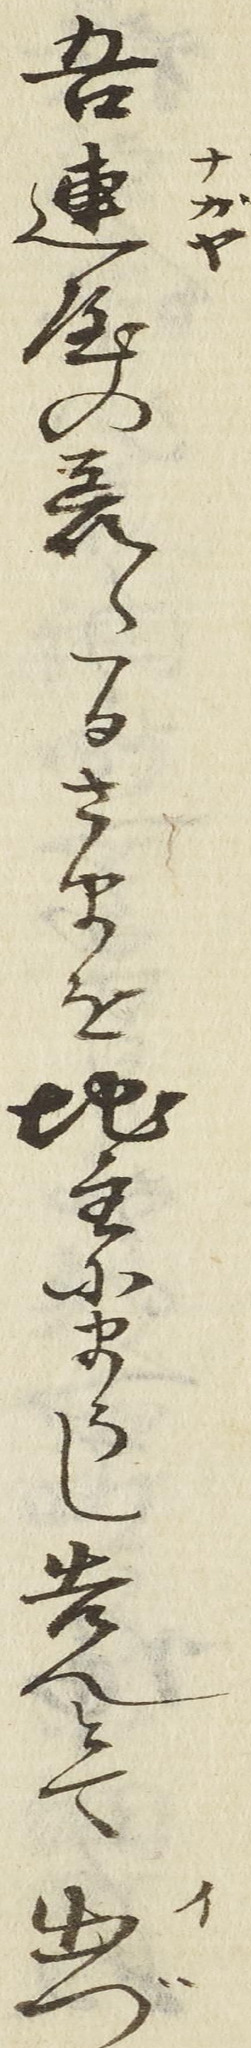吾連屋の荒たるさまを地主にまうし告んとて出づ
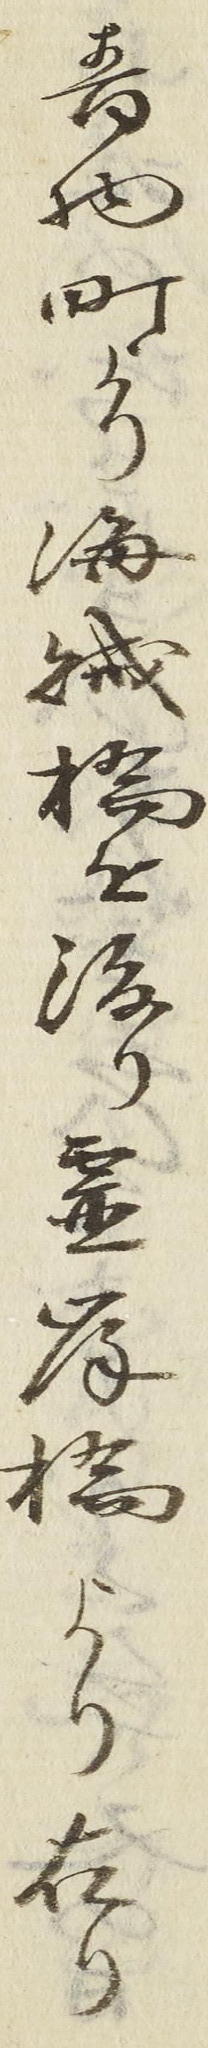青物町より海賊橋を渡り霊岸橋より右り
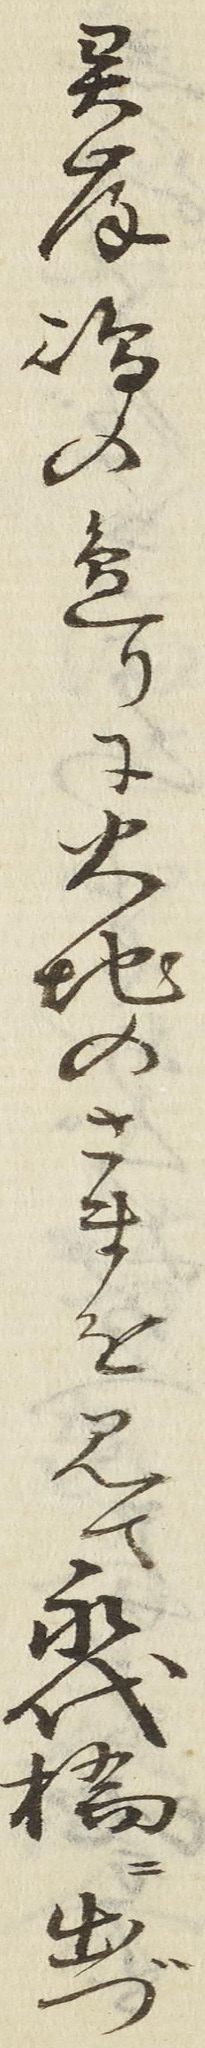霊岸島の辺りに火地のさまを見て永代橋に出づ
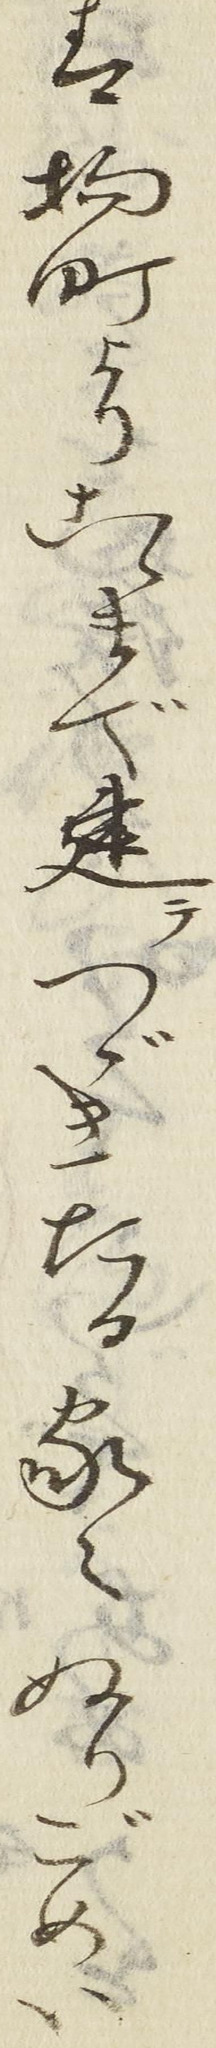青物町よりこゝまで建てつゞきたる家〻ぬりごめは
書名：やぶれ窓の記　全
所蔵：東京大学地震研究所図書室 Earthquake Research Institute Library, The University of Tokyo, JAPAN
